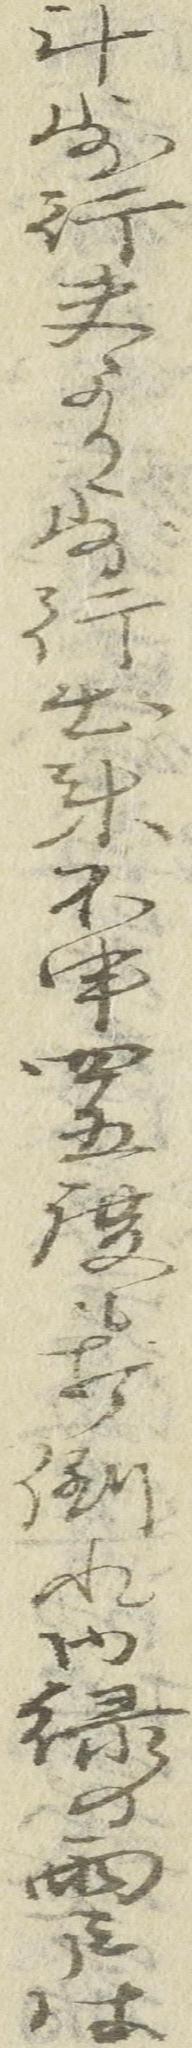計歩行夫より歩行出来不申四五度も打倒れ内緑の雨戸は
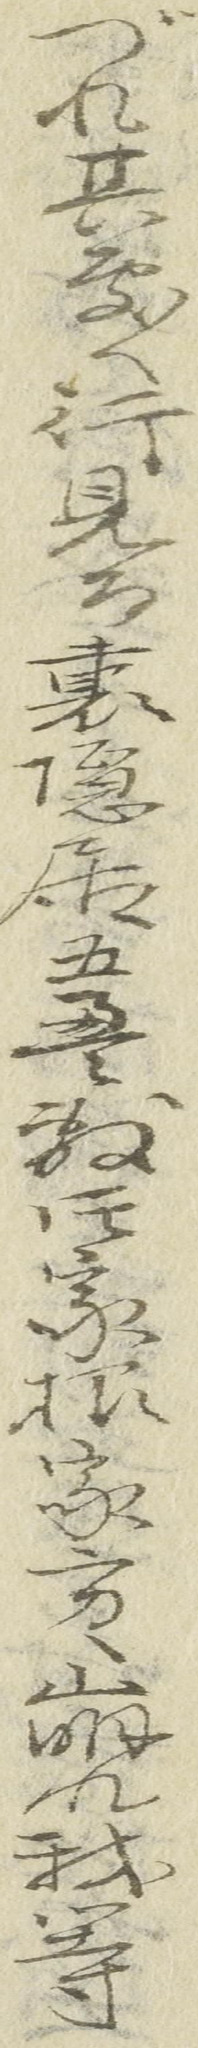づれ其處へ行見る裏隠居五畳敷片家根家方へ崩れ我等
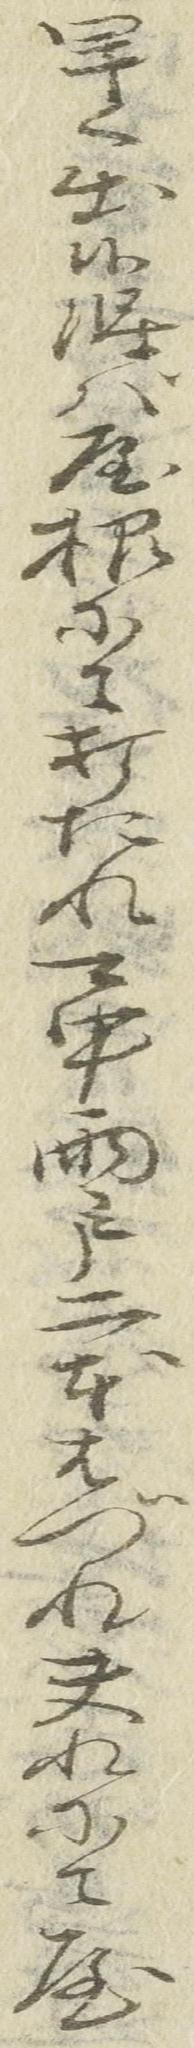早く出候得ば屋根にて打たれて中雨戸二本はづれ夫れにて屋
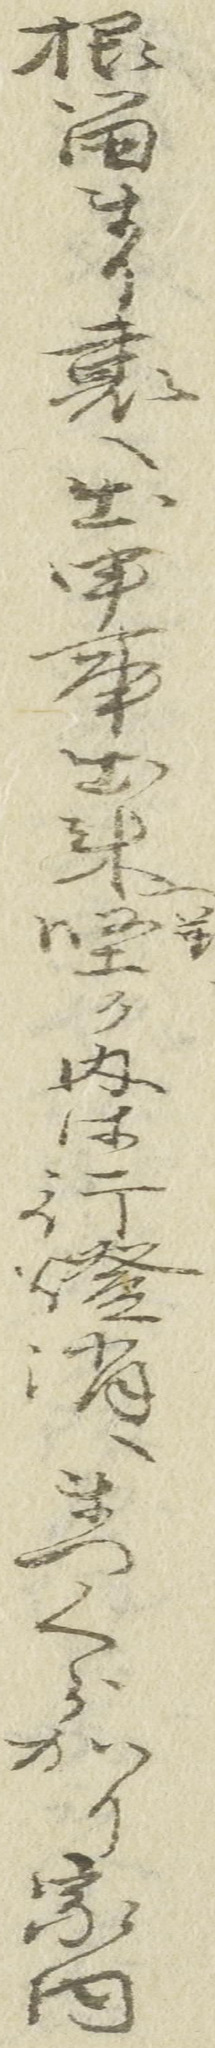根留まり裏へ出申事出来堅く内は行燈消へまつくらかり家内
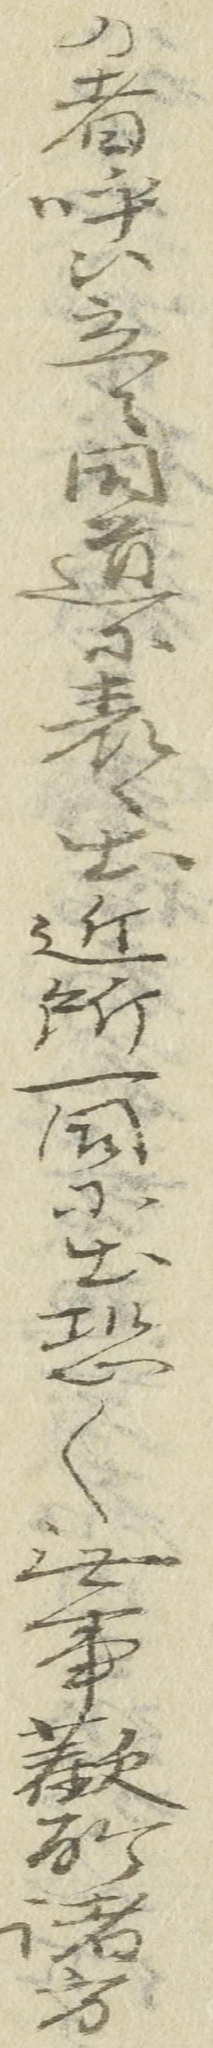の者呼ひ立て同道に表へ出近所一同に出恐〳〵無事歓所諸方
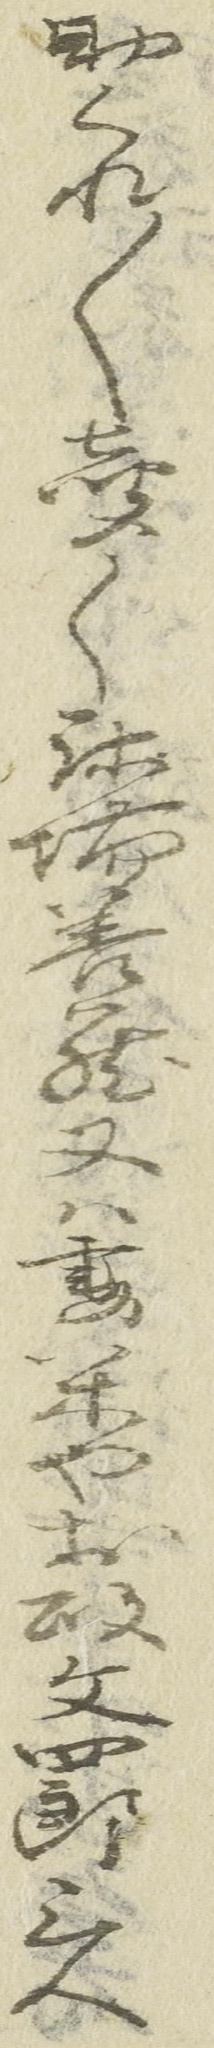助くれ〳〵聲〳〵弥場善蔵又は米や村政文四郎三人
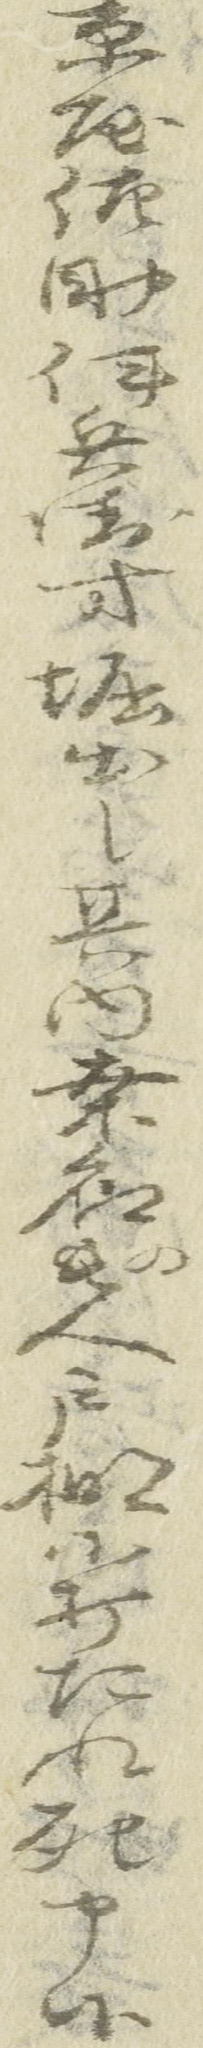京屋佐助伊兵衛方堀出し其内桑名の人戸棚に打たれ死申候
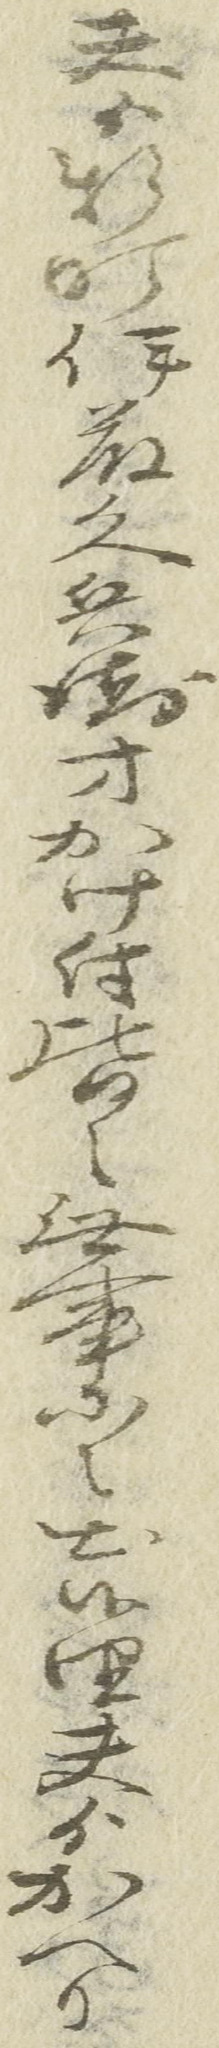夫ゟ新町伊藤久兵衛方かけ付皆々無事にて出候由夫ゟかへり
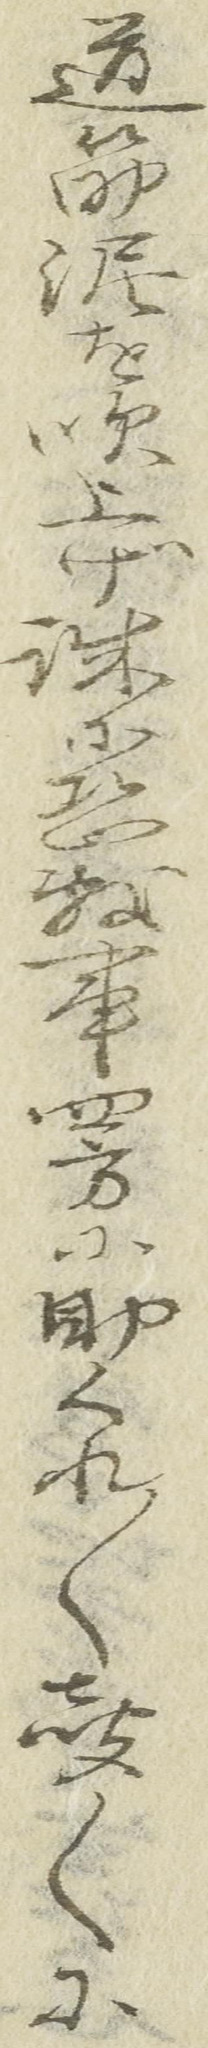道筋泥を吹上げ誠に恐敷事四方に助くれ〳〵声〳〵に
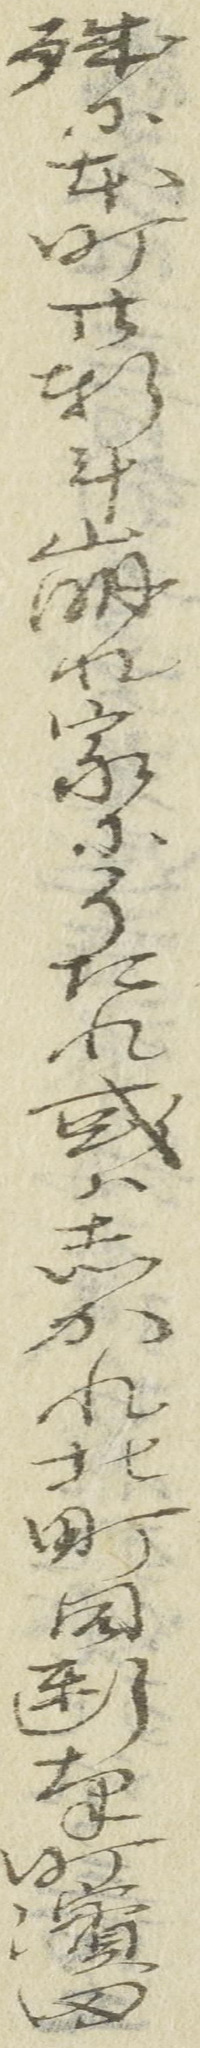殊に本町廿軒計崩れ家にうたれ或はしかれ北町同断南町濱田
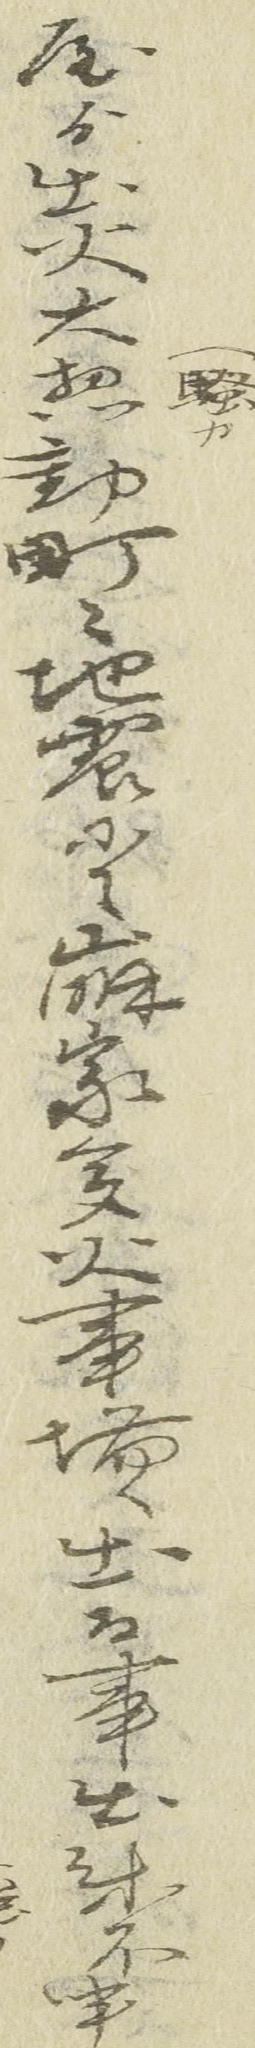屋ゟ出火大惣動町々地震にて崩家多火事場へ出る事出来不申
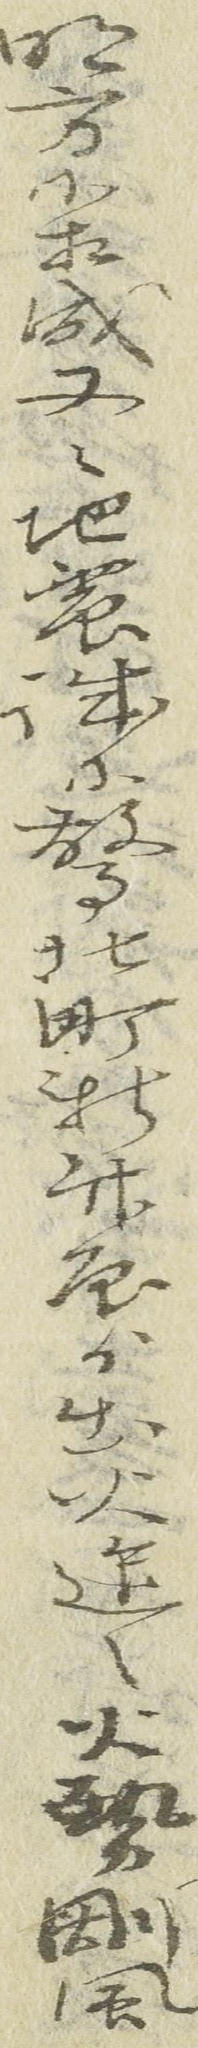明方に相成又〻地震誠に驚北町新升屋ゟ出火追し火勢剛風
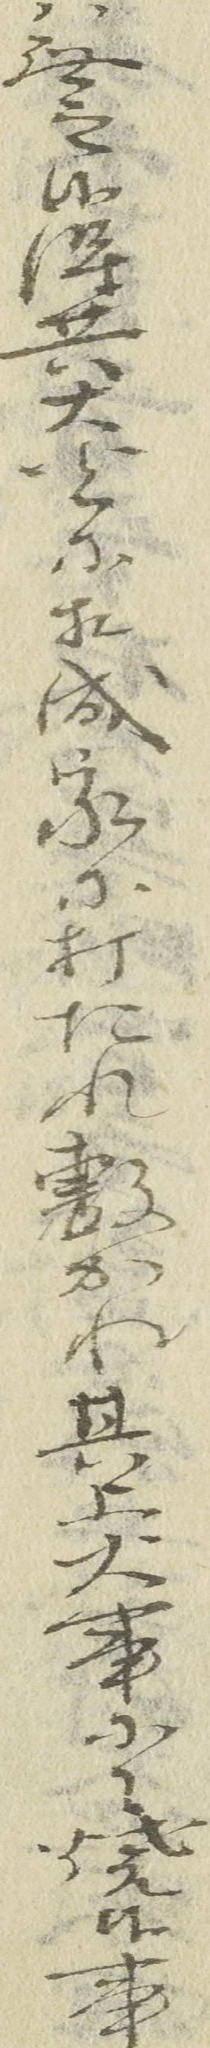は無之候得共大火に相成家に打たれ敷かれ其上火事にて焼候事
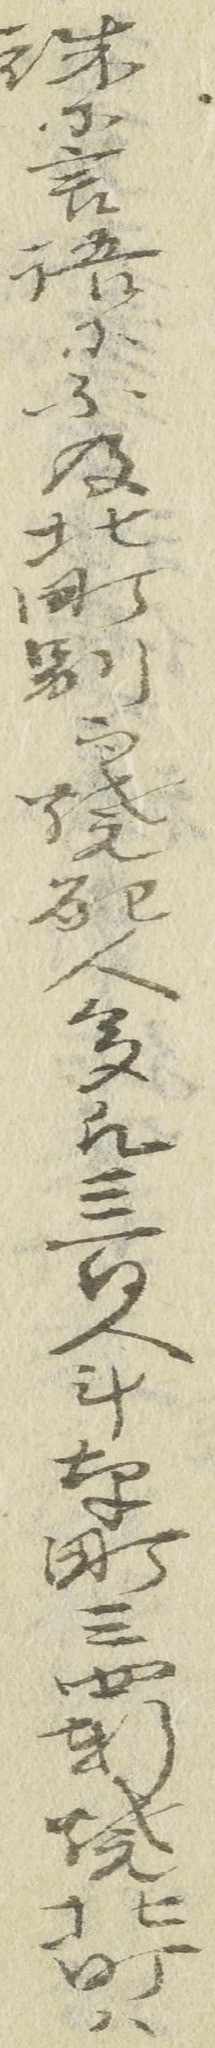誠に言語に不及北町別而焼死人多凡三百人計南町三四軒焼北町は
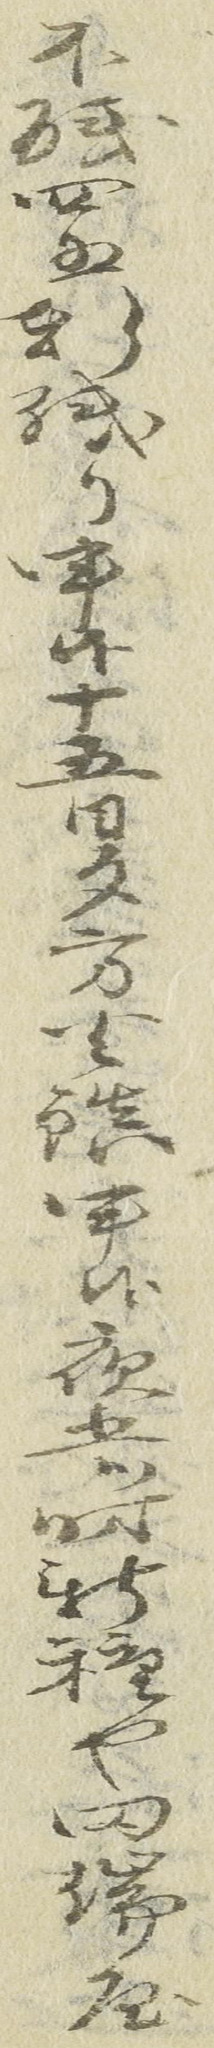不残四五軒残り申候十五日夕方火鎮申候夜五ツ時新種や田端屋
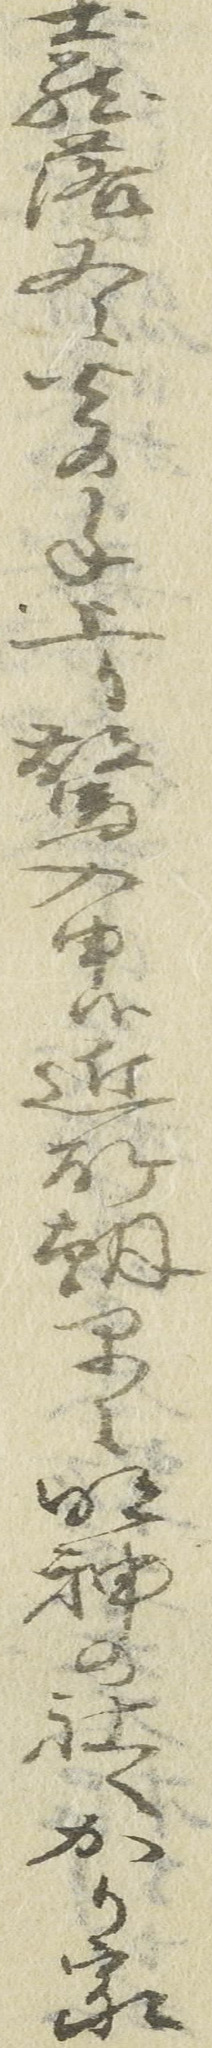土蔵落又々火の手上り驚入申候近所朝早く明神の社へかり家
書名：地震前兆集　全
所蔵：東京大学地震研究所図書室 Earthquake Research Institute Library, The University of Tokyo, JAPAN
